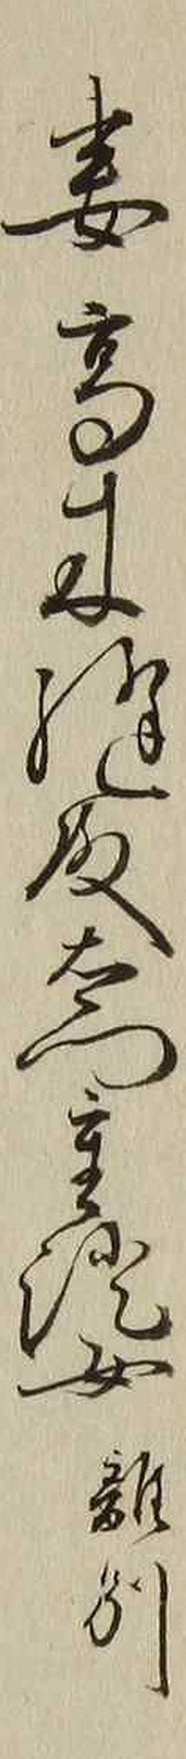妻高木縫殿右衛門重證女離別
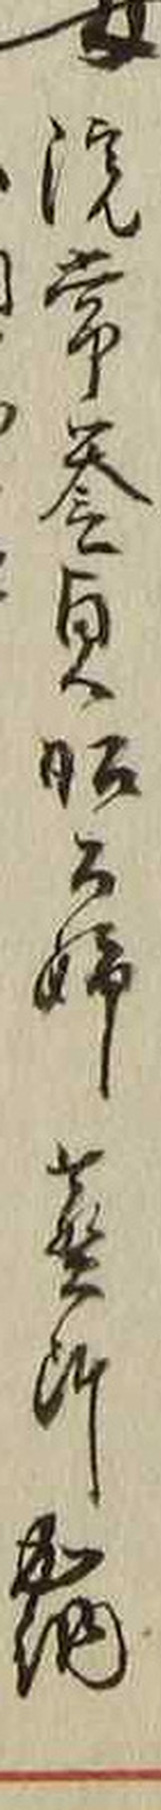院常誉貞昭大姉葬所加納
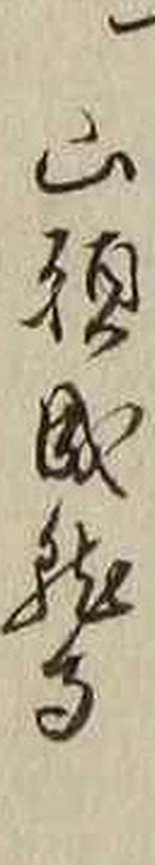山願成就寺
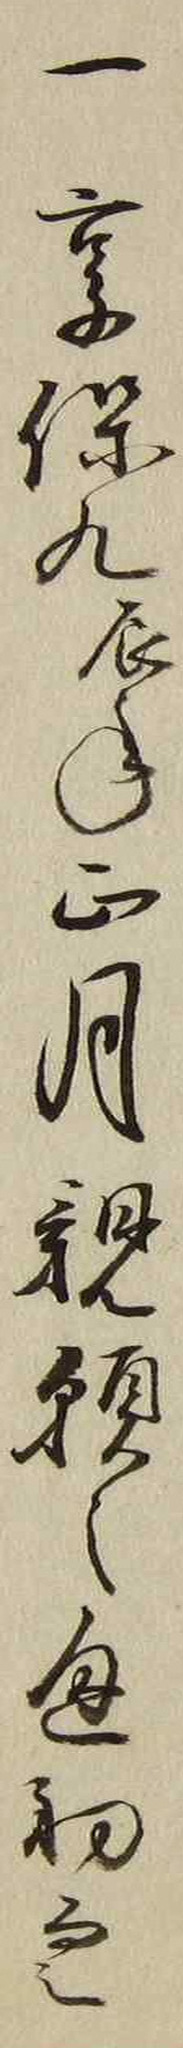一享保九辰年正月親願之通初而之
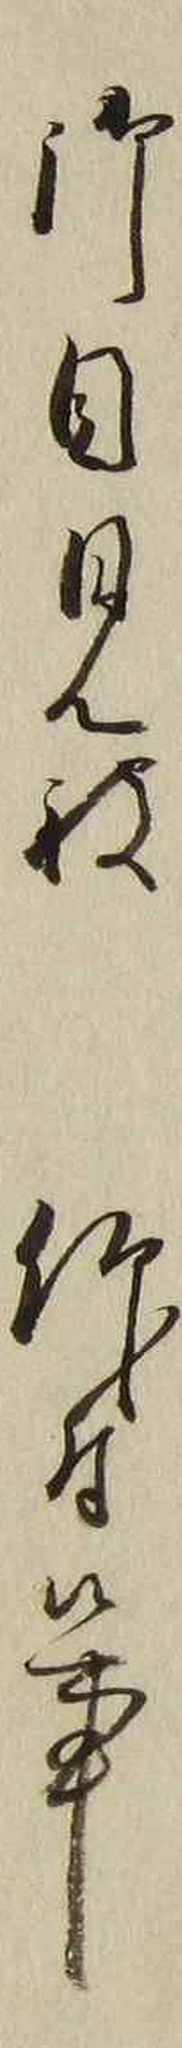御目見被仰付候事
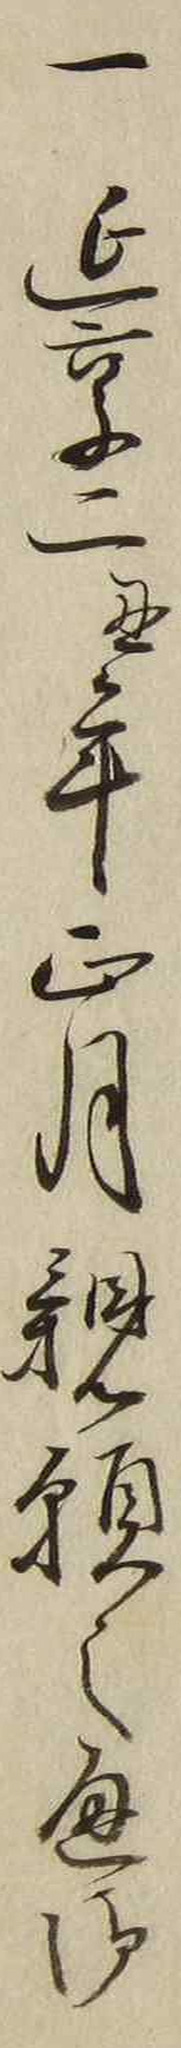一延享二丑年正月親願之通御

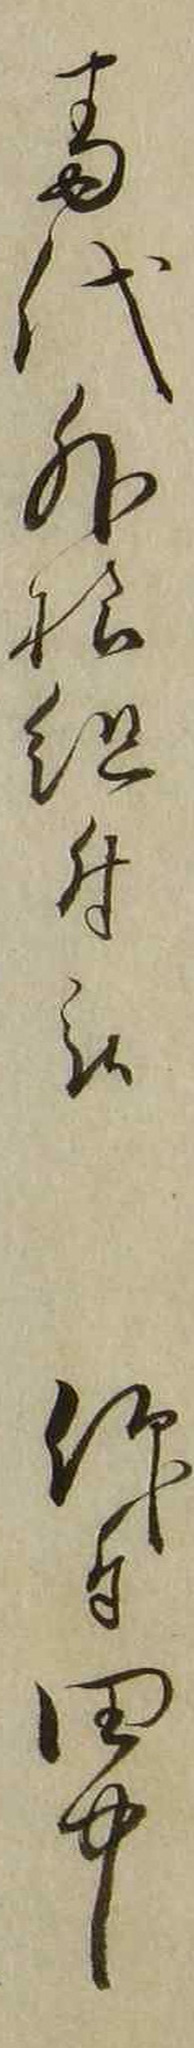番代外様組付被仰付田中
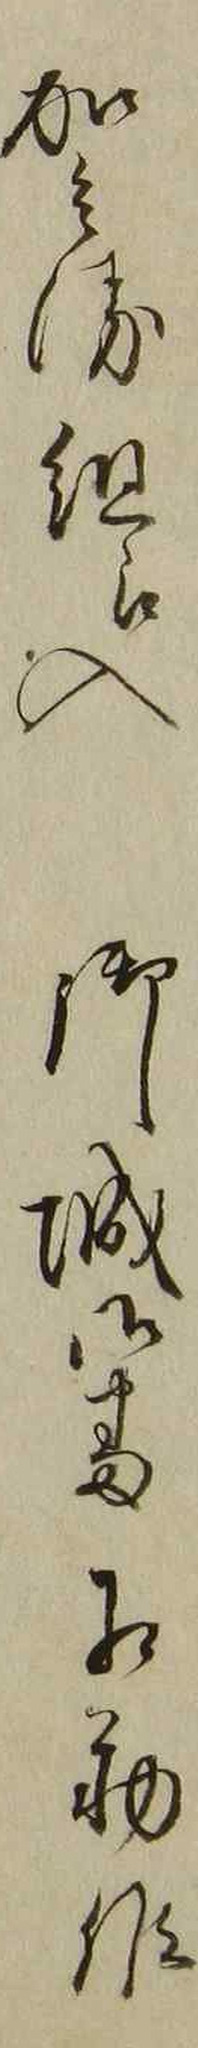加兵衛組江入御城御番相勤候
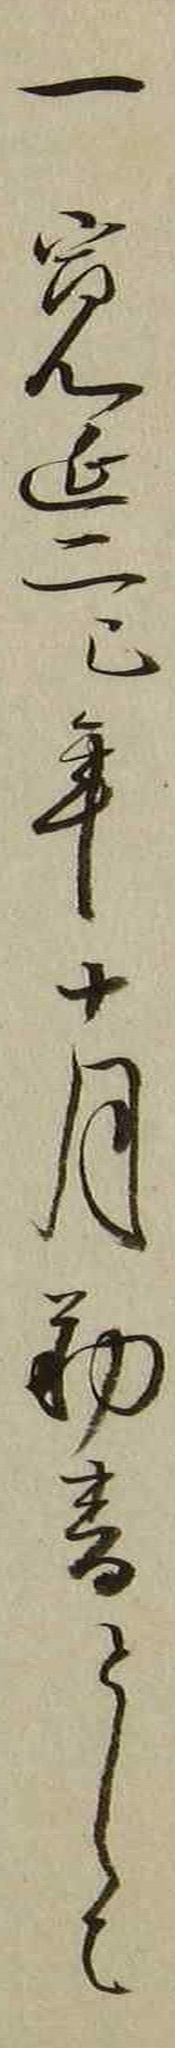一寛延二巳年十月勤番として
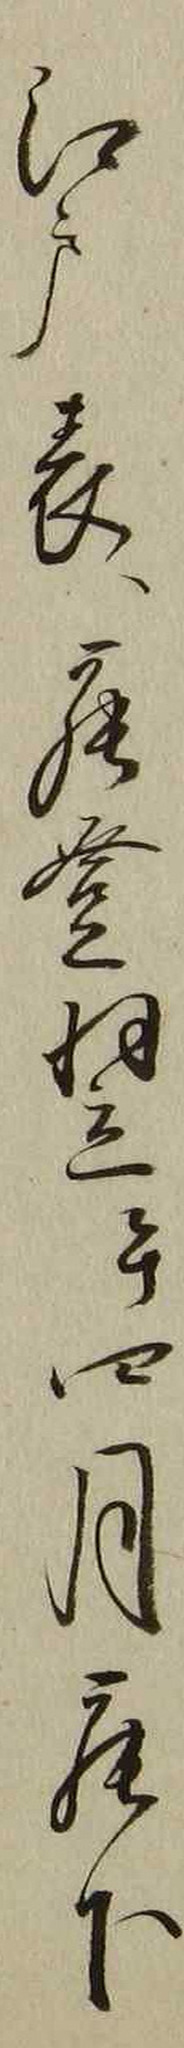江戸表へ罷登翌午四月罷下
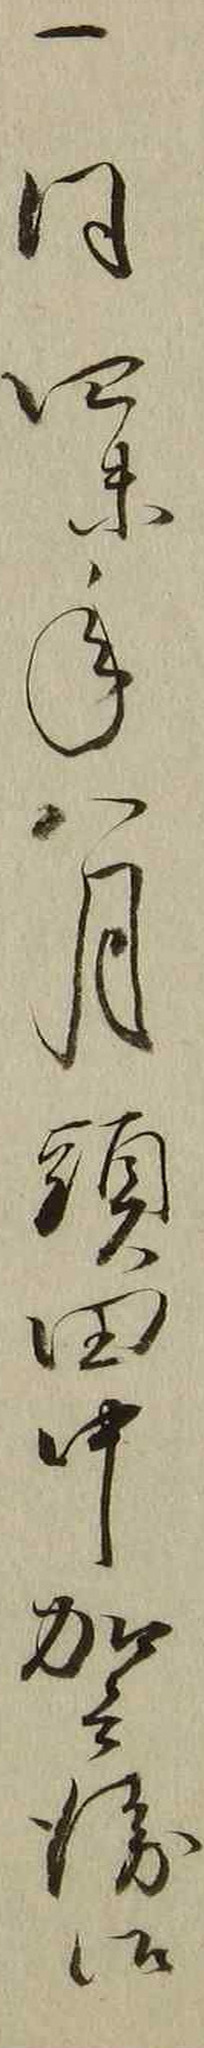一同四未年八月頭田中加兵衛御
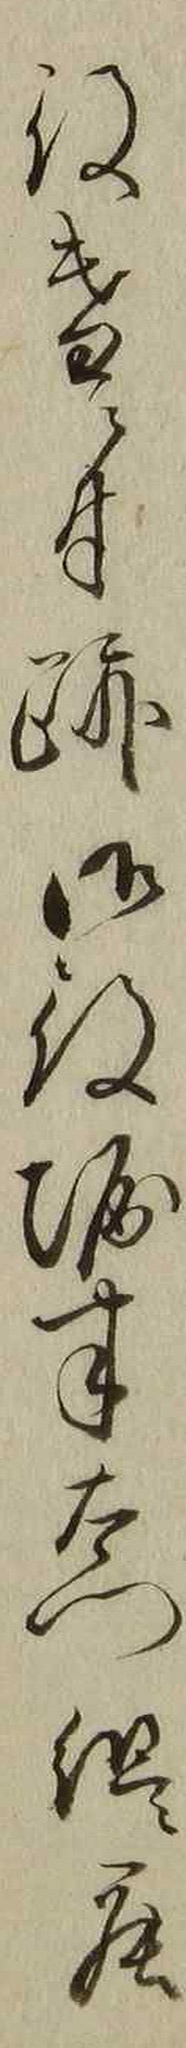役替ニ付跡御役堀半右衛門組ニ罷
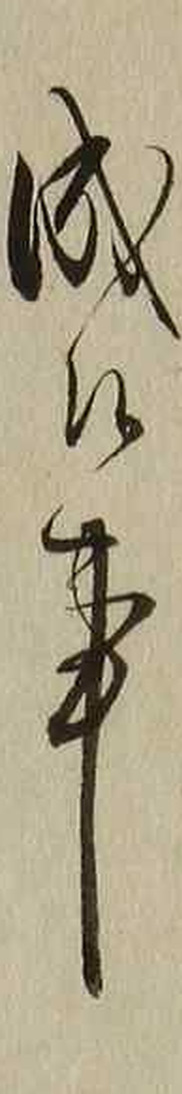成候事
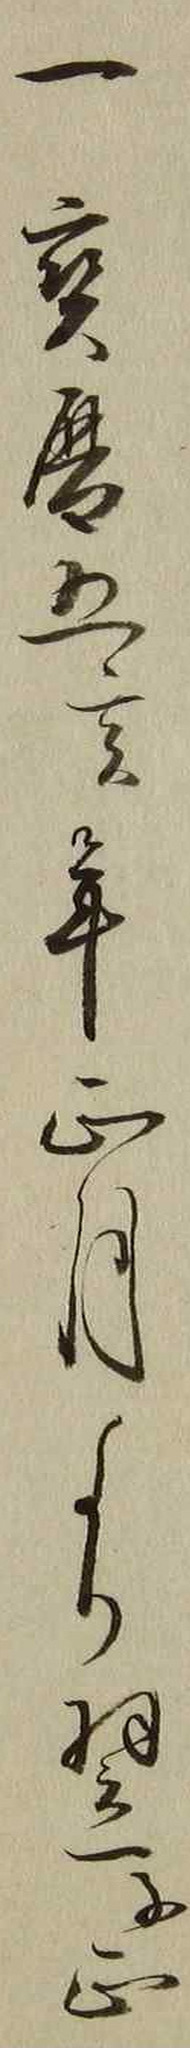一宝暦五亥年正月より翌子正
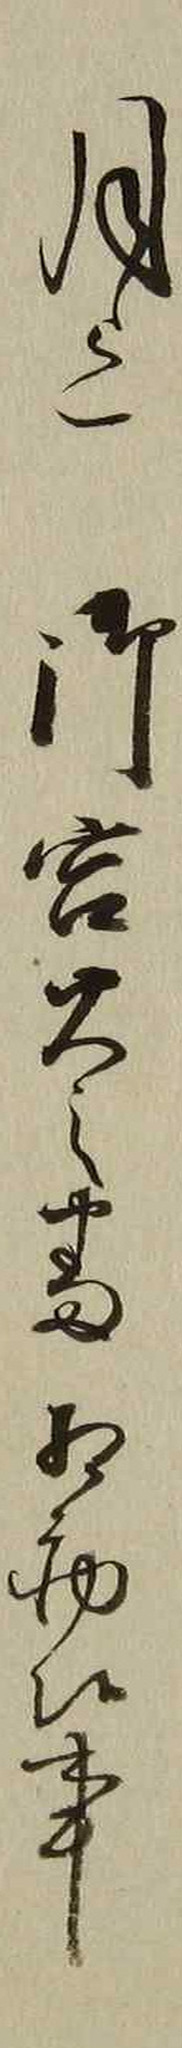月迄御宮火之番相勤候事
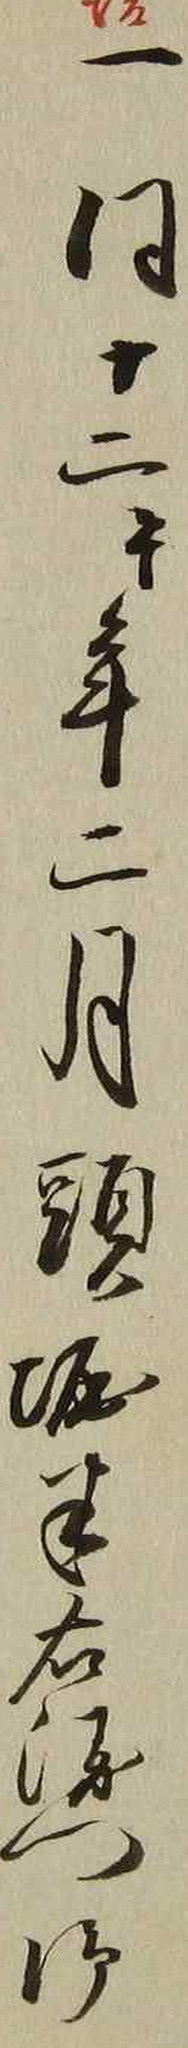後一同十二午年二月頭堀半右衛門御
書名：諸士系譜　巻之2　い之部2
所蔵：会津若松市立会津図書館
